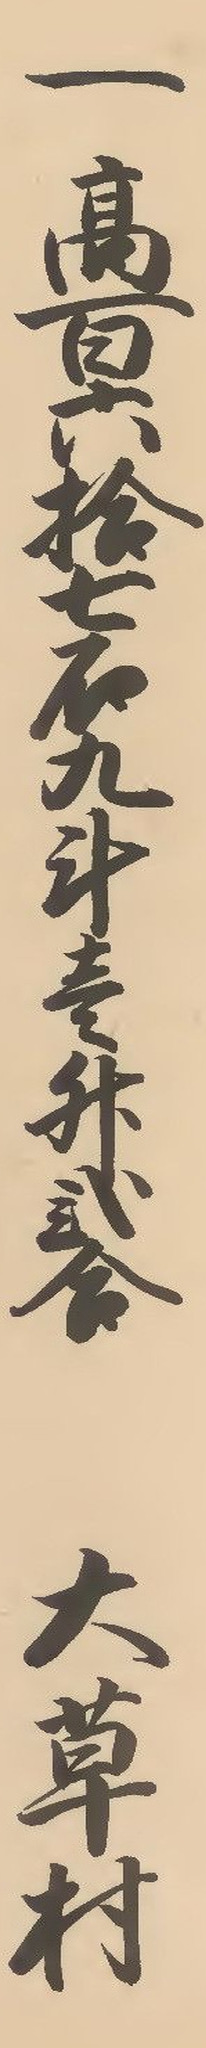一高百六拾七石九斗壱升弐合大草村
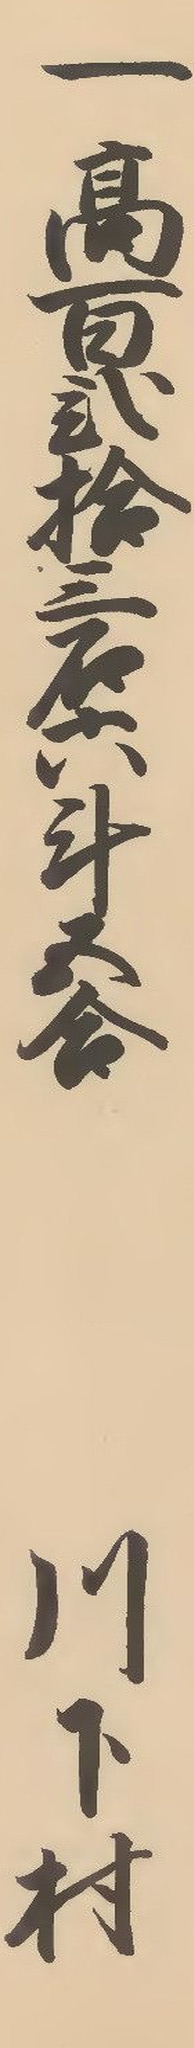一高百弐拾三石六斗五合川下村
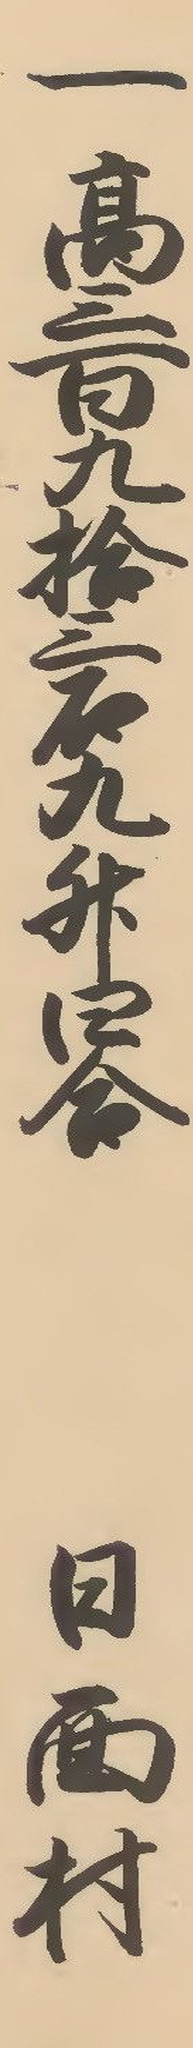一高三百九拾三石九升四合日面村
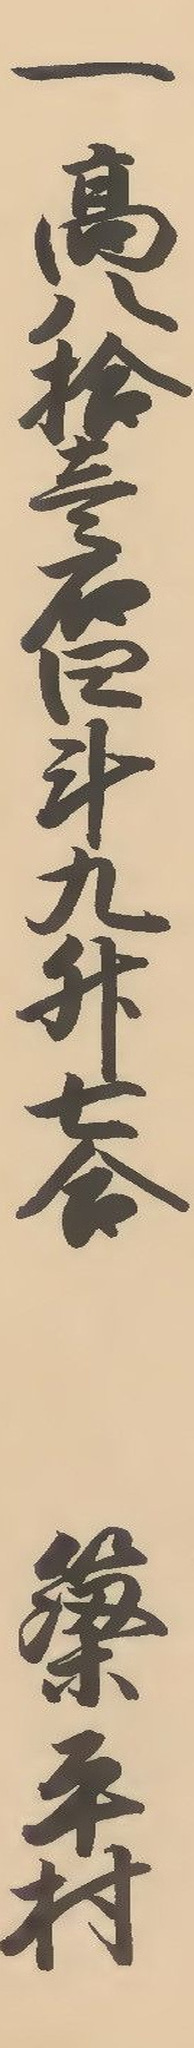一高八拾壱石四斗九升七合簗平村

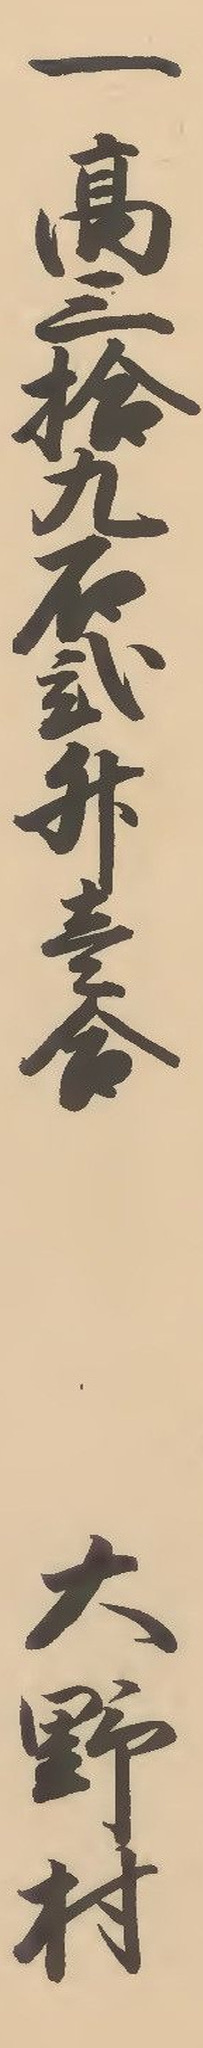一高三拾九石弐升壱合大野村
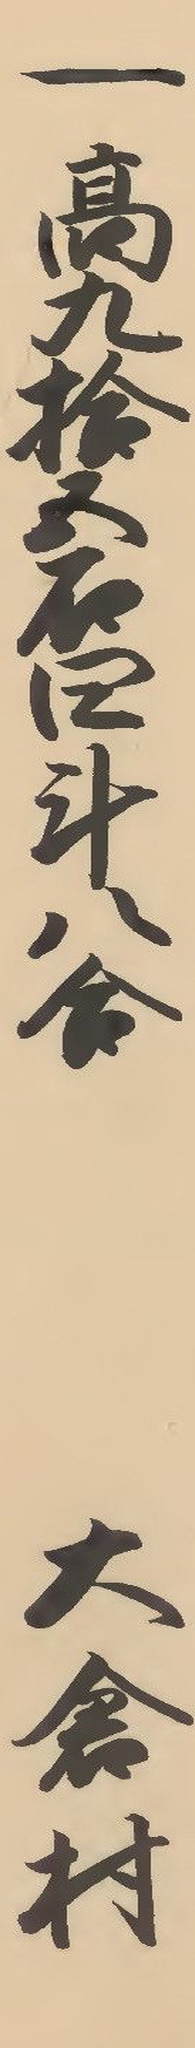一高九拾五石四斗八合大倉村
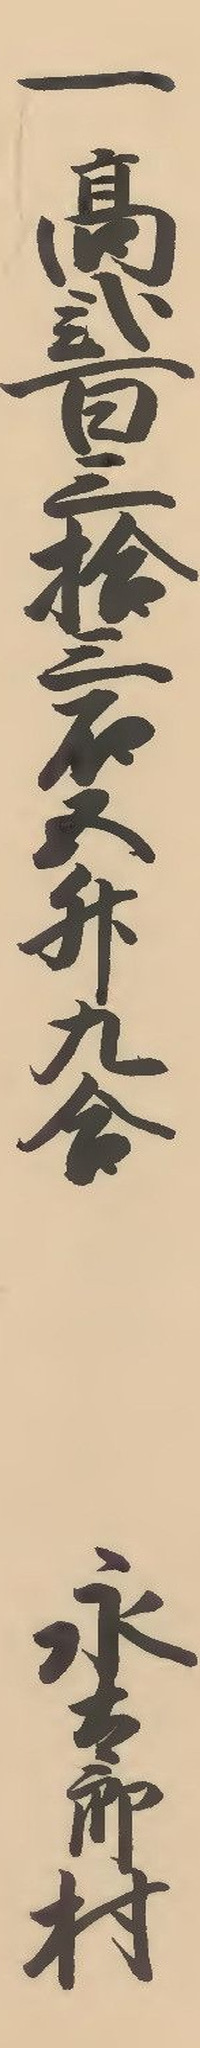一高弐百三拾三石五升九合永太郎村
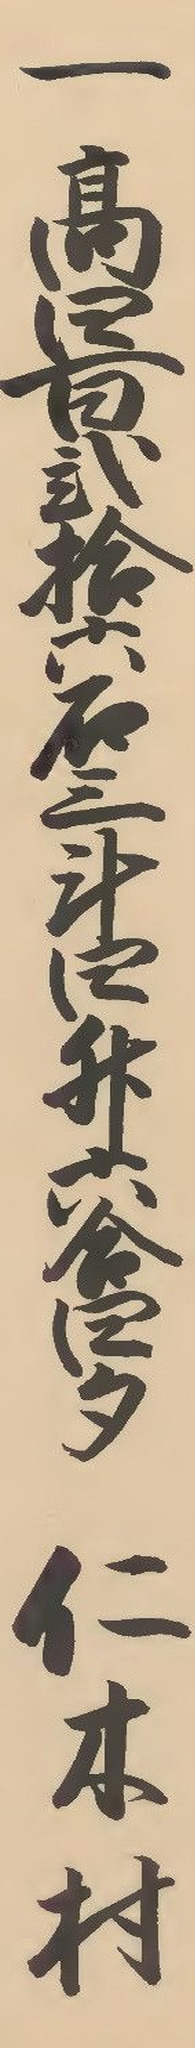一高四百弐拾六石三斗四升六合四勺仁木村
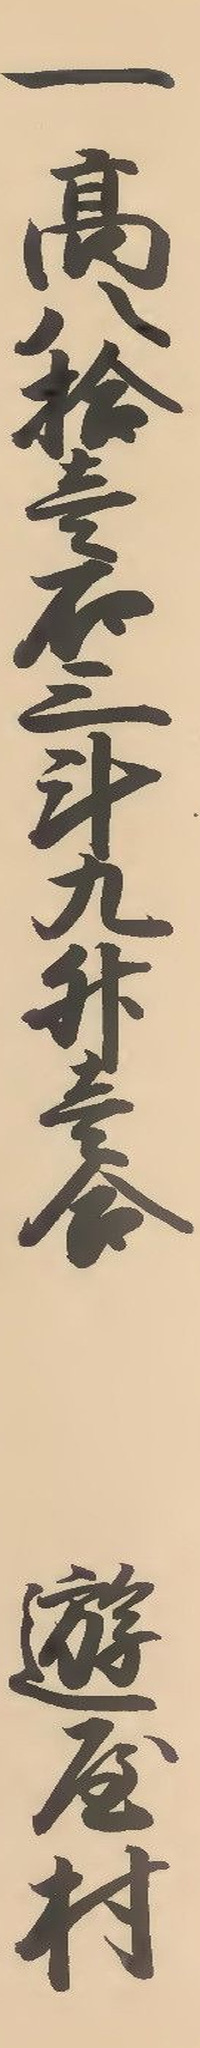一高八拾壱石三斗九升壱合遊屋村
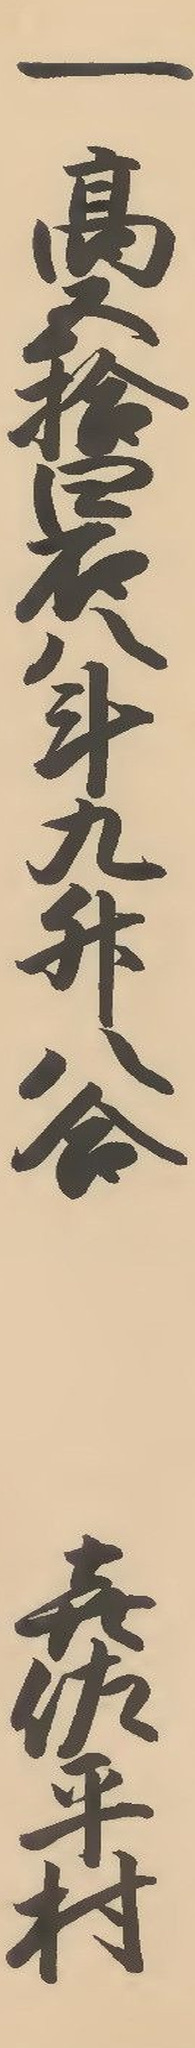一高五拾四石八斗九升八合喜佐平村
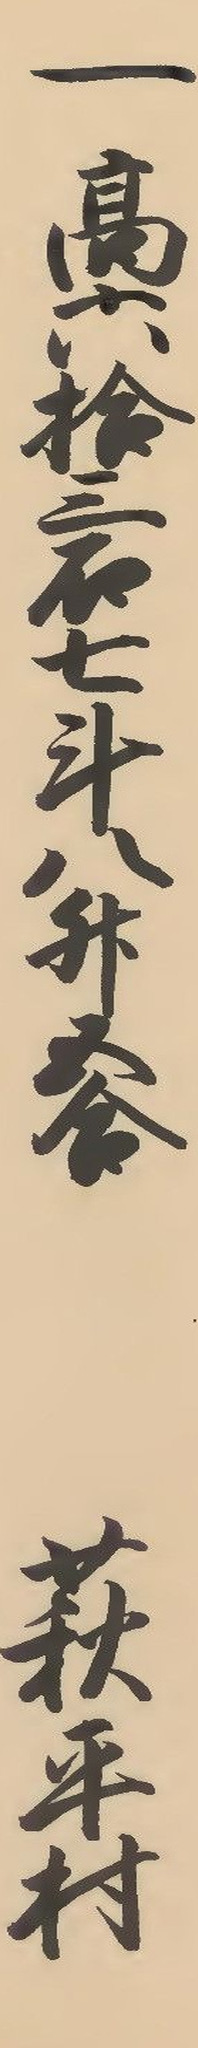一高六拾三石七斗八升五合萩平村
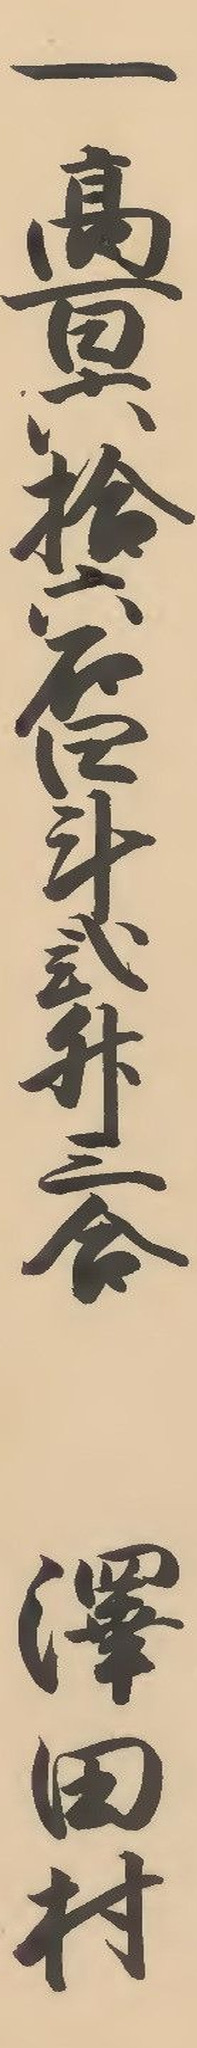一高百六拾六石四斗弐升三合沢田村

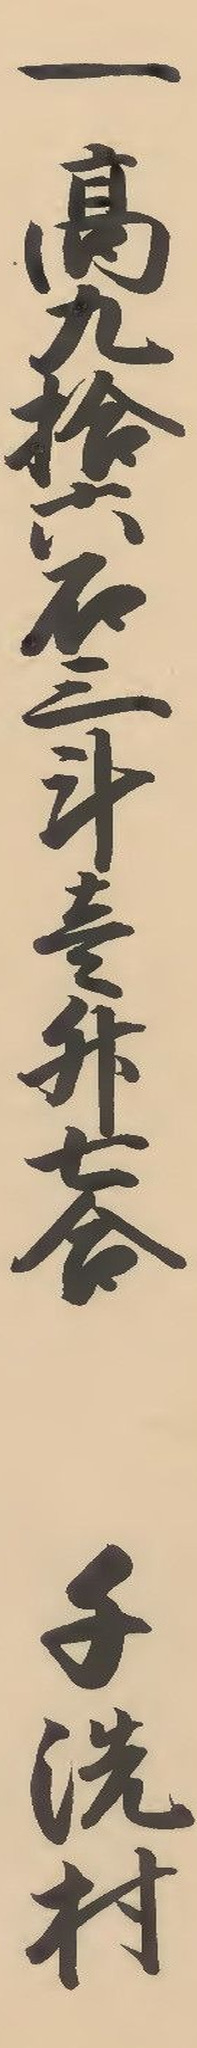一高九拾六石三斗壱升七合千洗村
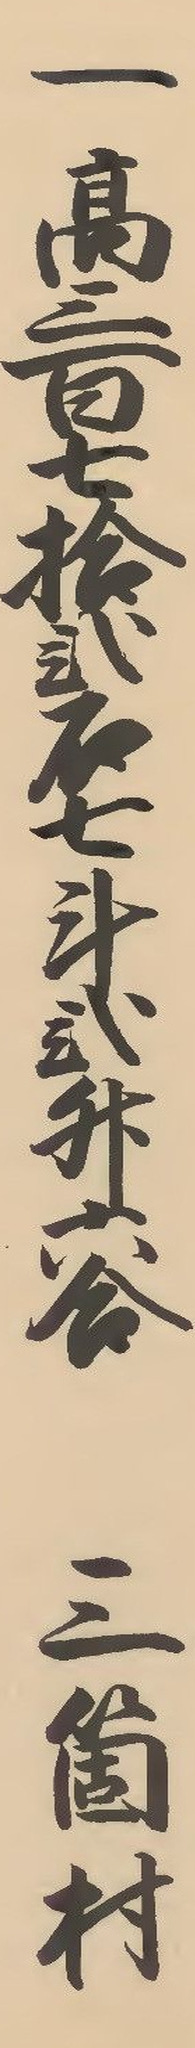一高三百七拾弐石七斗弐升六合三箇村
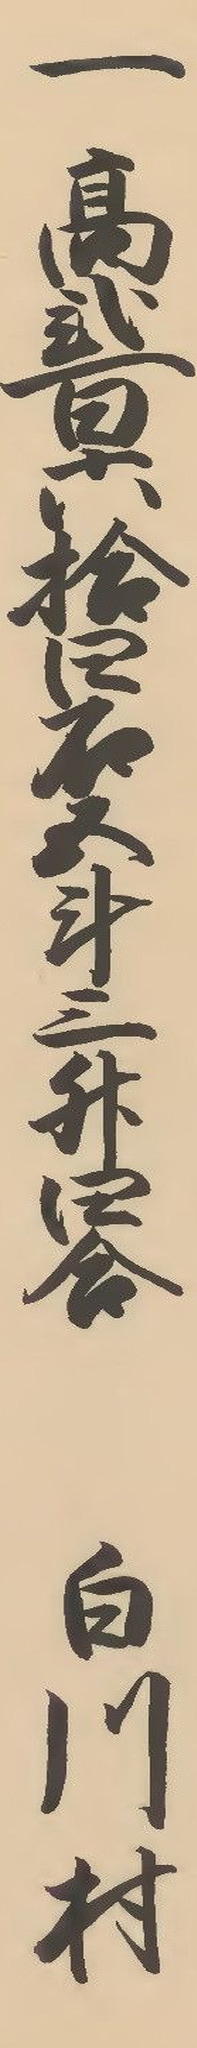一高弐百六拾四石五斗三升四合白川村
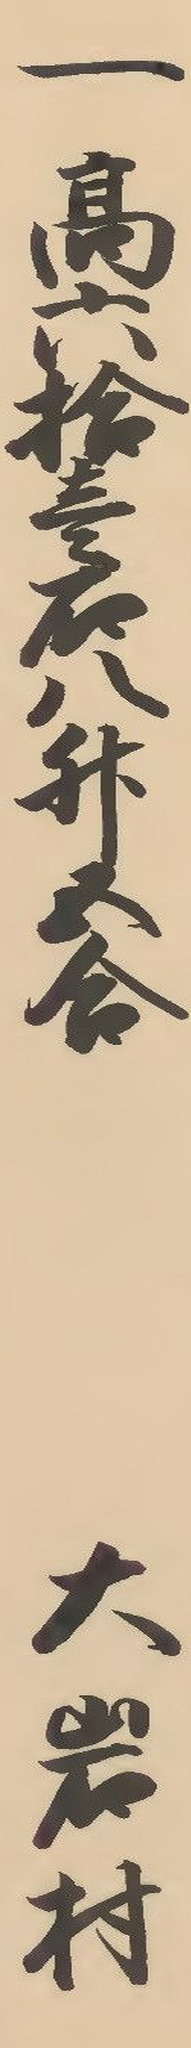一高六拾壱石八升五合大岩村
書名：三河国郷帳
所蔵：国立公文書館 National Archives of Japan
